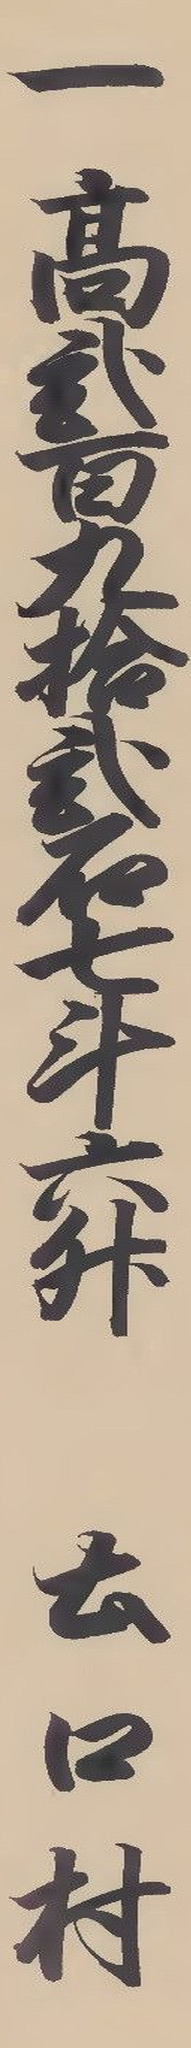一高弐百九拾弐石七斗六升土口村
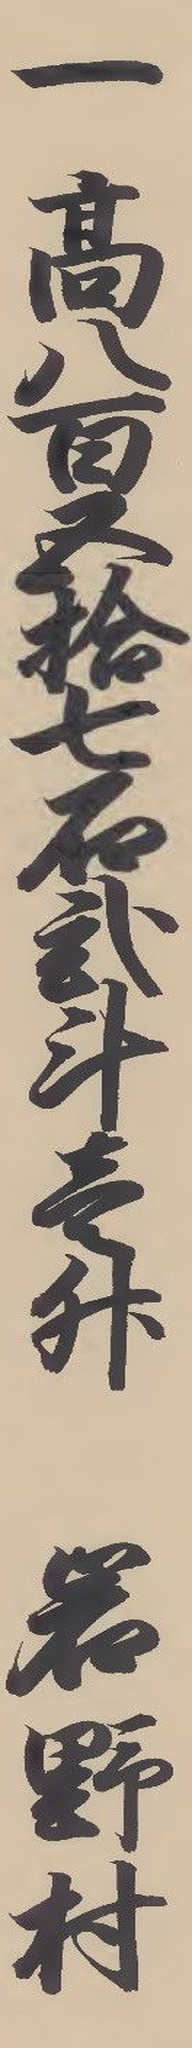一高八百五拾七石弐斗壱升岩野村
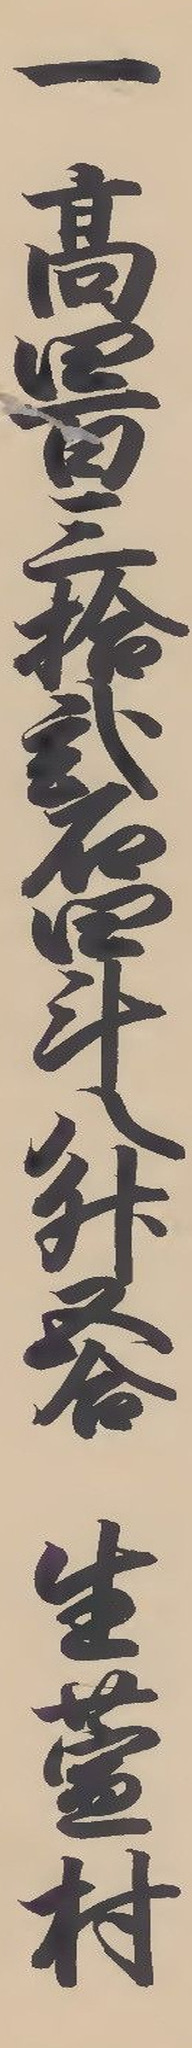一高四百三拾弐石四斗八升五合生萱村

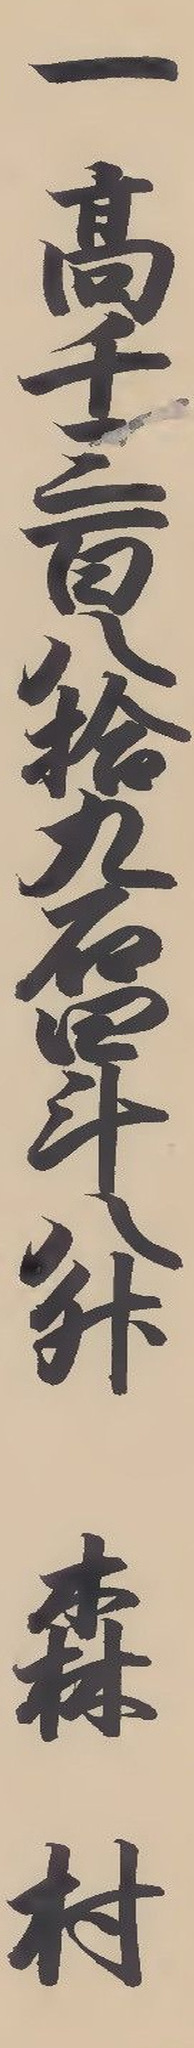一高千三百八拾九石四斗八升森村
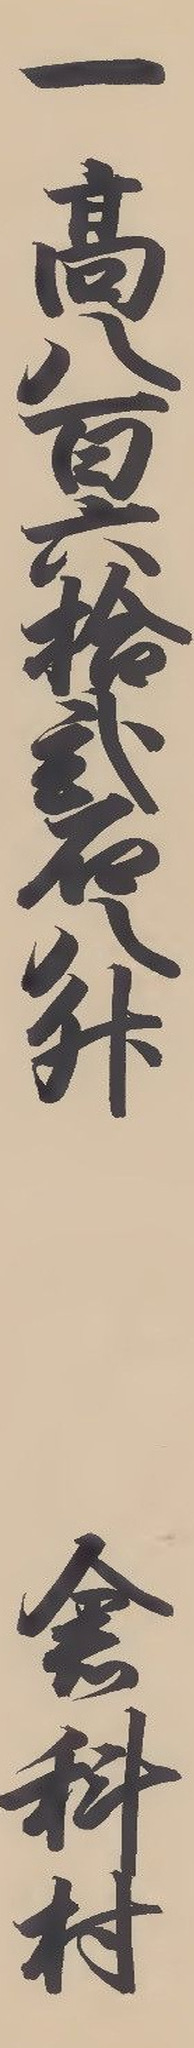一高八百六拾弐石八升倉科村
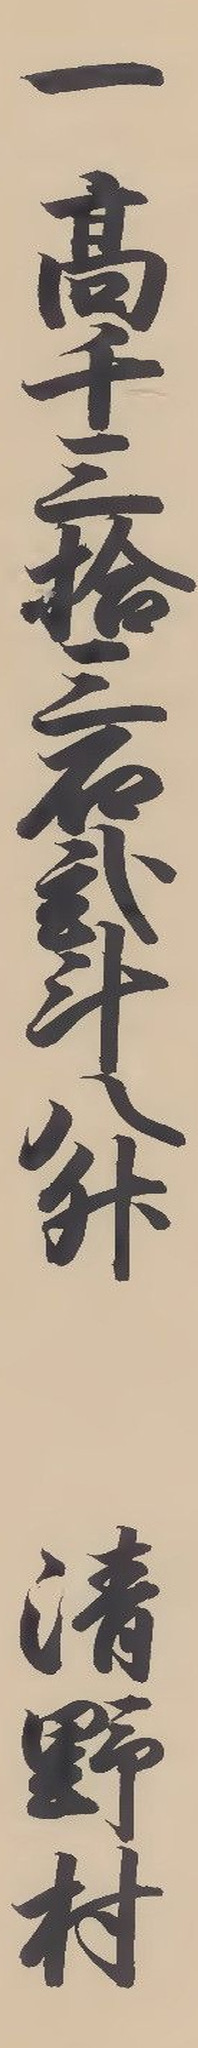一高千三拾三石弐斗八升清野村
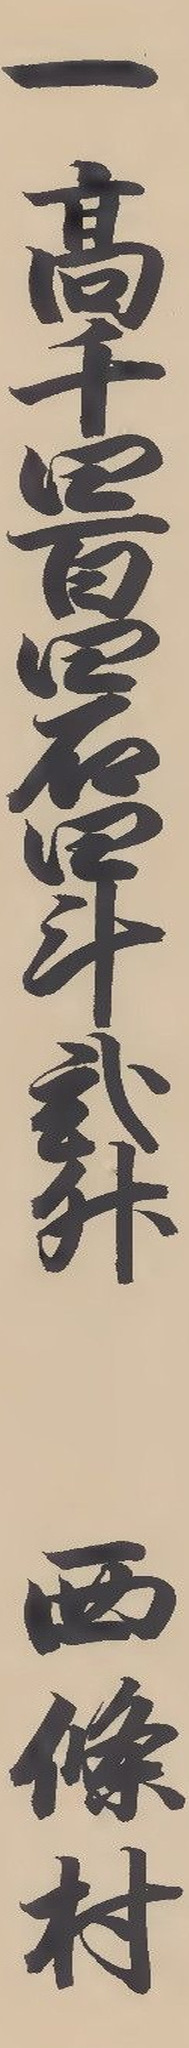一高千四百四石四斗弐升西条村
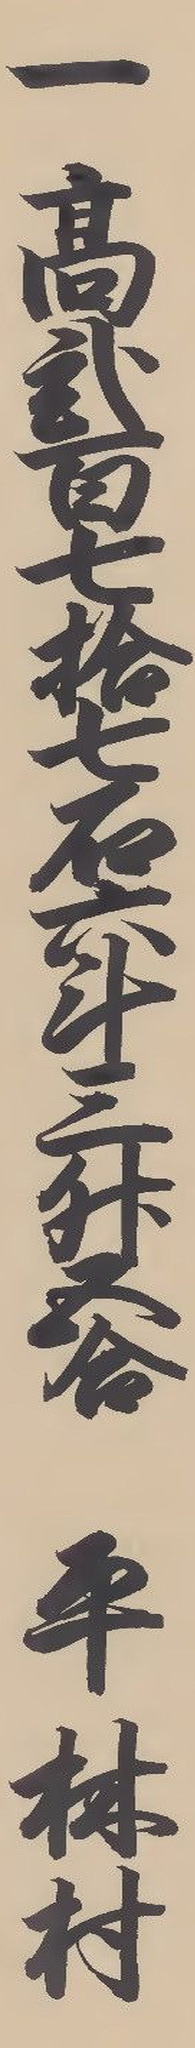一高弐百七拾七石六斗三升五合平林村
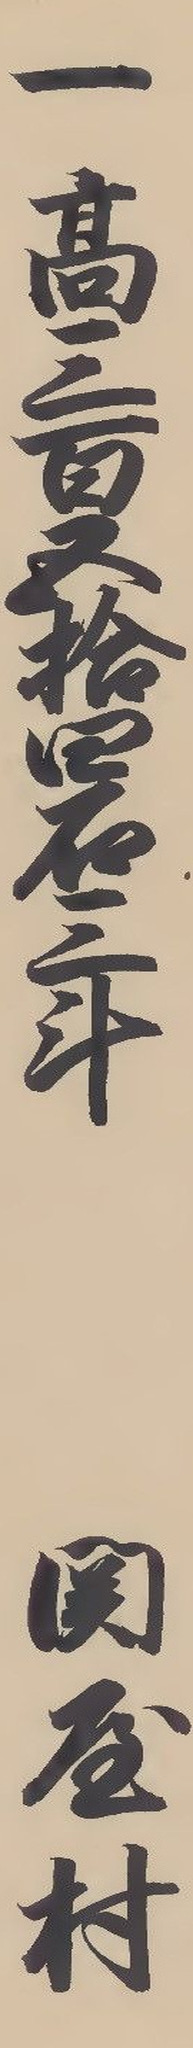一高三百五拾四石三斗関屋村
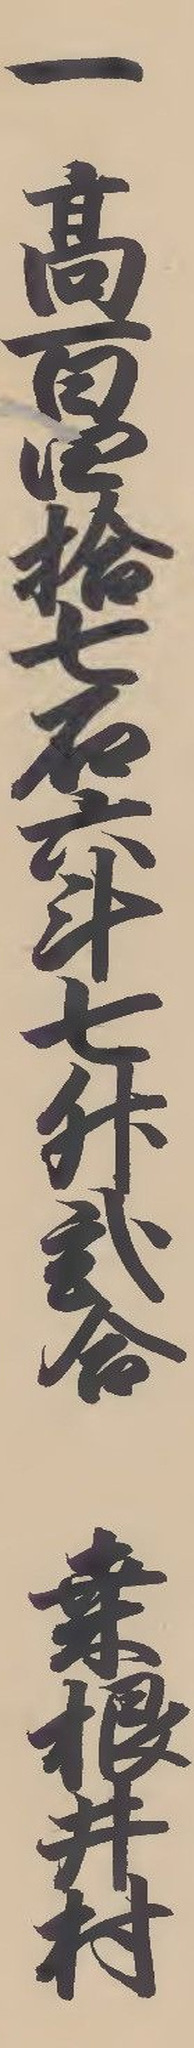一高百四拾七石六斗七升弐合桑根井村

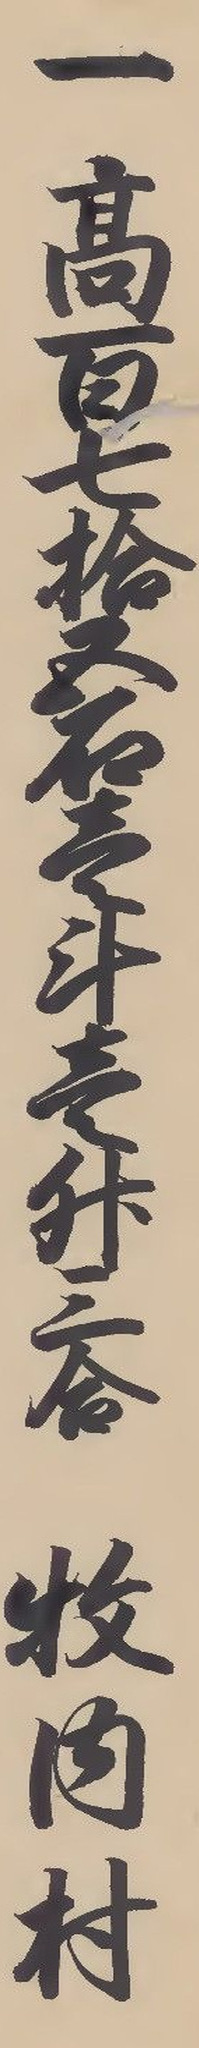一高百七拾五石壱斗壱升三合牧内村
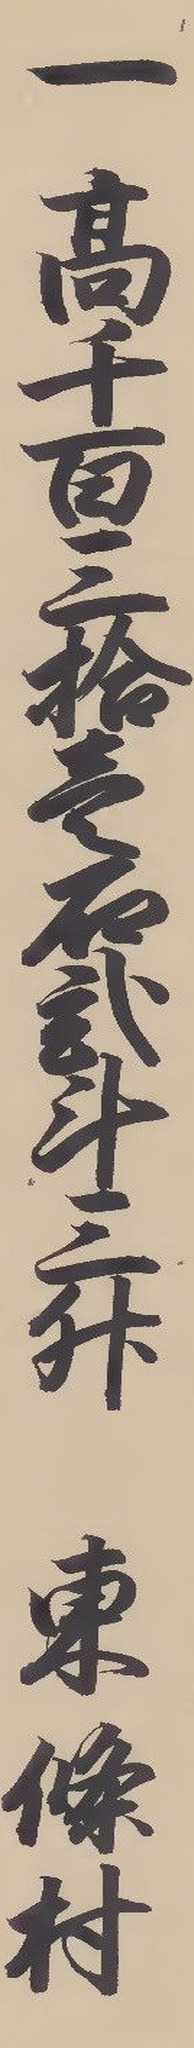一高千百三拾壱石弐斗三升東条村
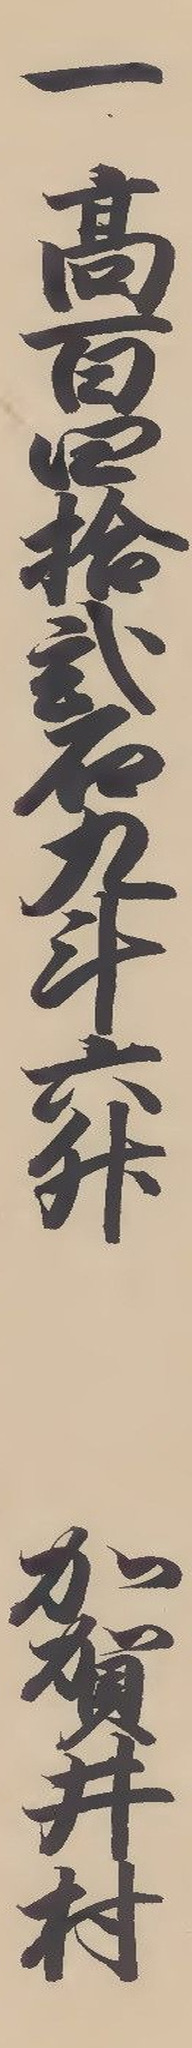一高百四拾弐石九斗六升加賀井村
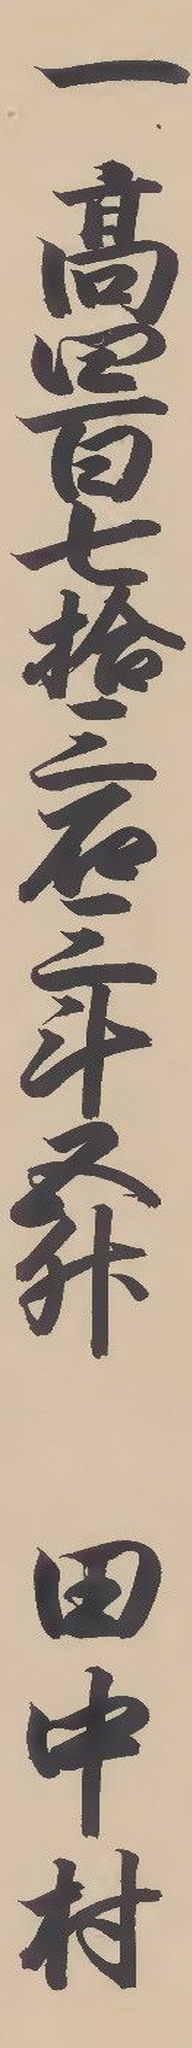一高四百七拾三石三斗五升田中村
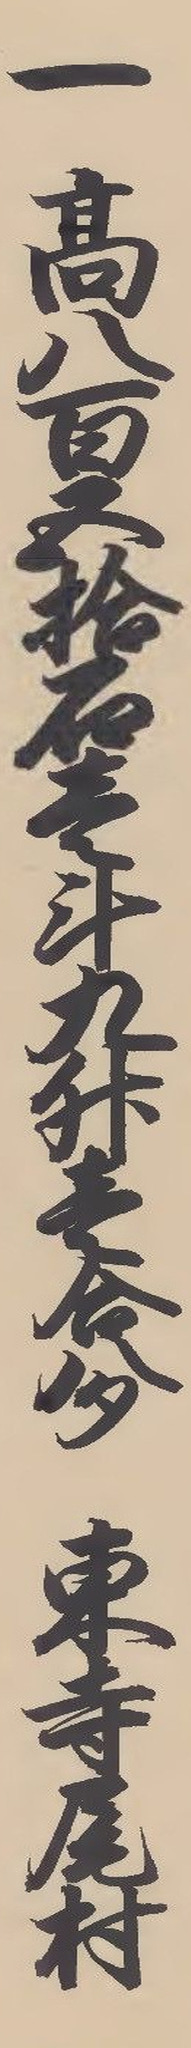一高八百五拾石壱斗九升壱合八勺東寺尾村
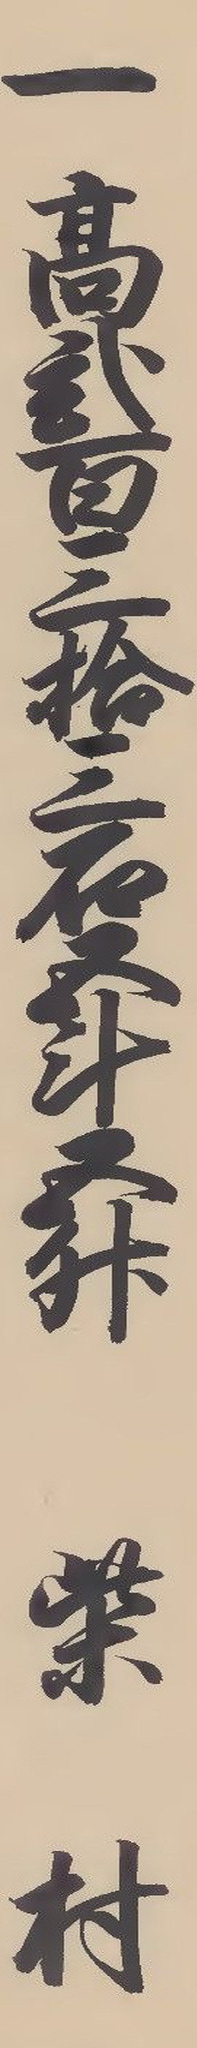一高弐百三拾三石五斗五升柴村
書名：信濃国郷帳
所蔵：国立公文書館 National Archives of Japan
